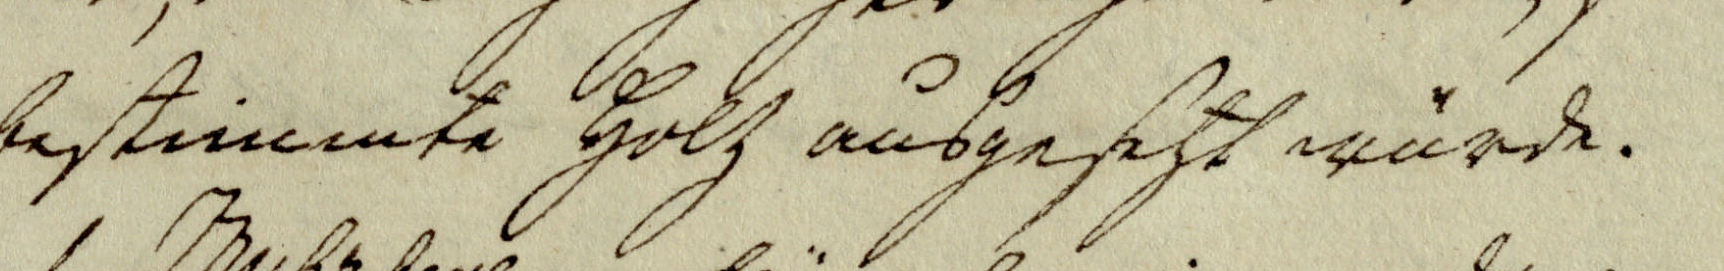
bestimmte Holz ausgesetzt würde.
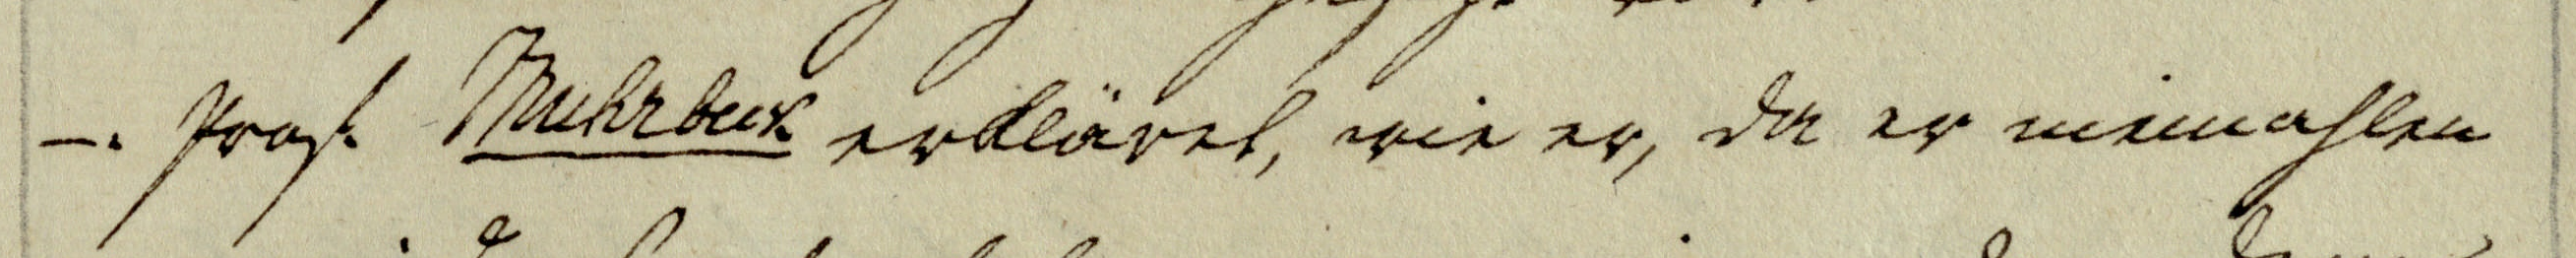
Prof. Muhrbeck erkläret, wie er, da er niemahlen
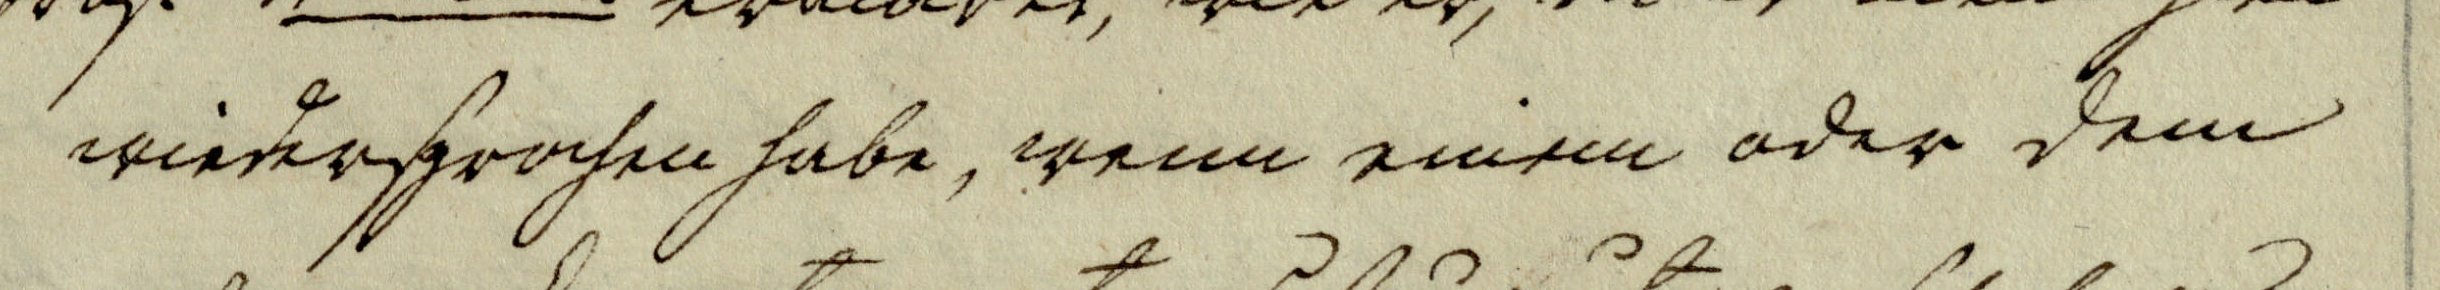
wiedersprochen habe, wenn einem oder dem
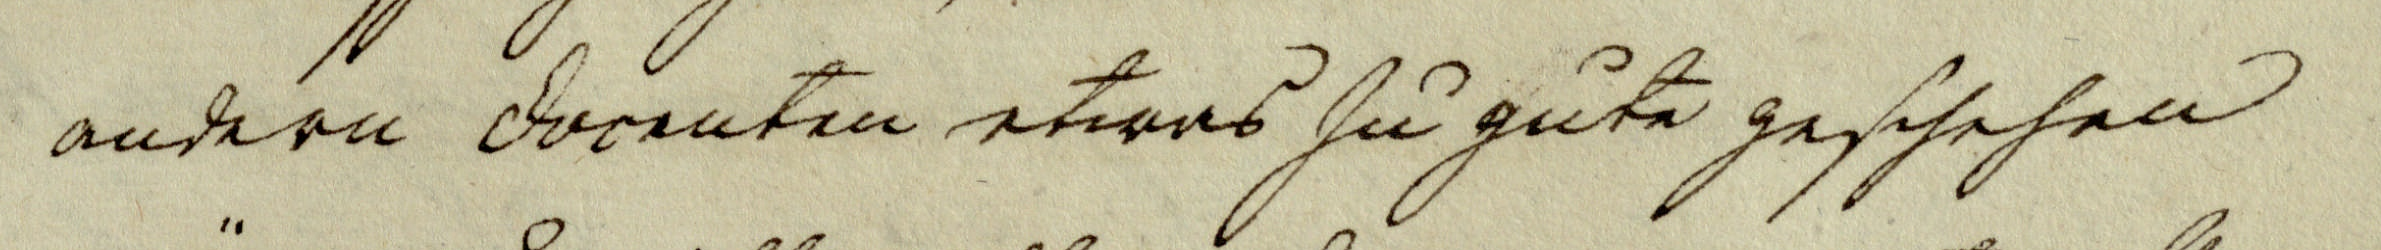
andern Docenten etwas zu gute geschehen
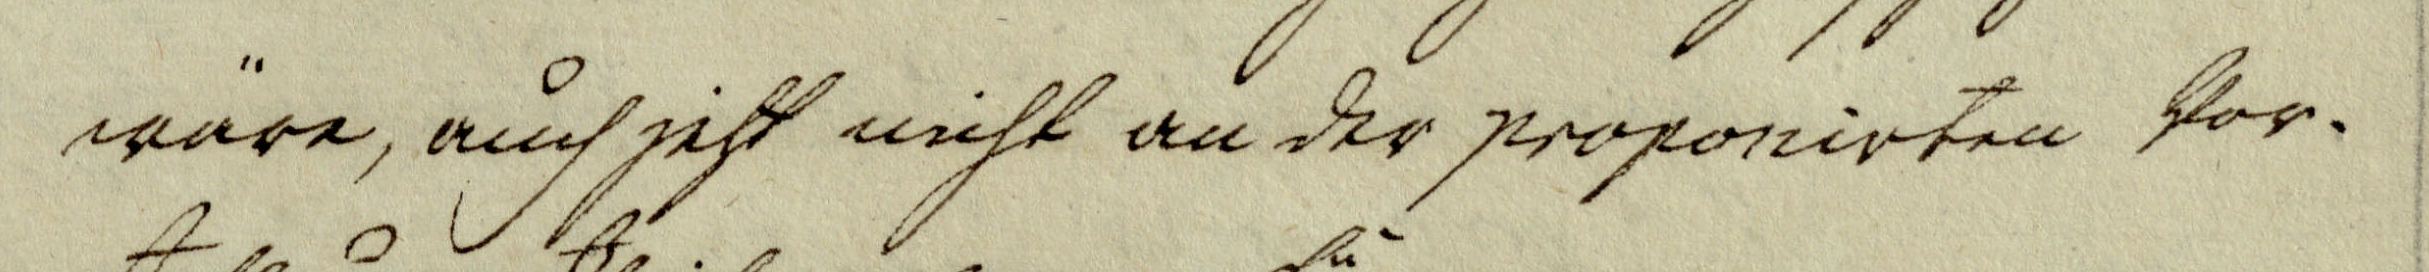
wäre, auch jetzt nicht an der proponirten Vor¬
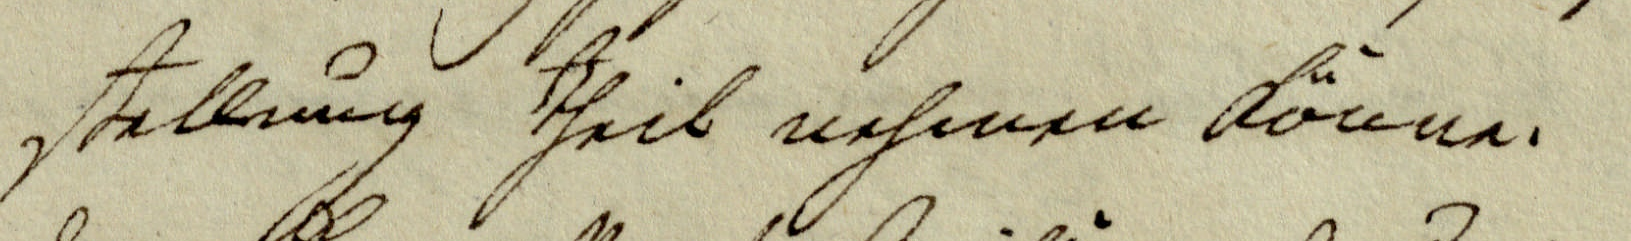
tellung Theil nehmen könne.
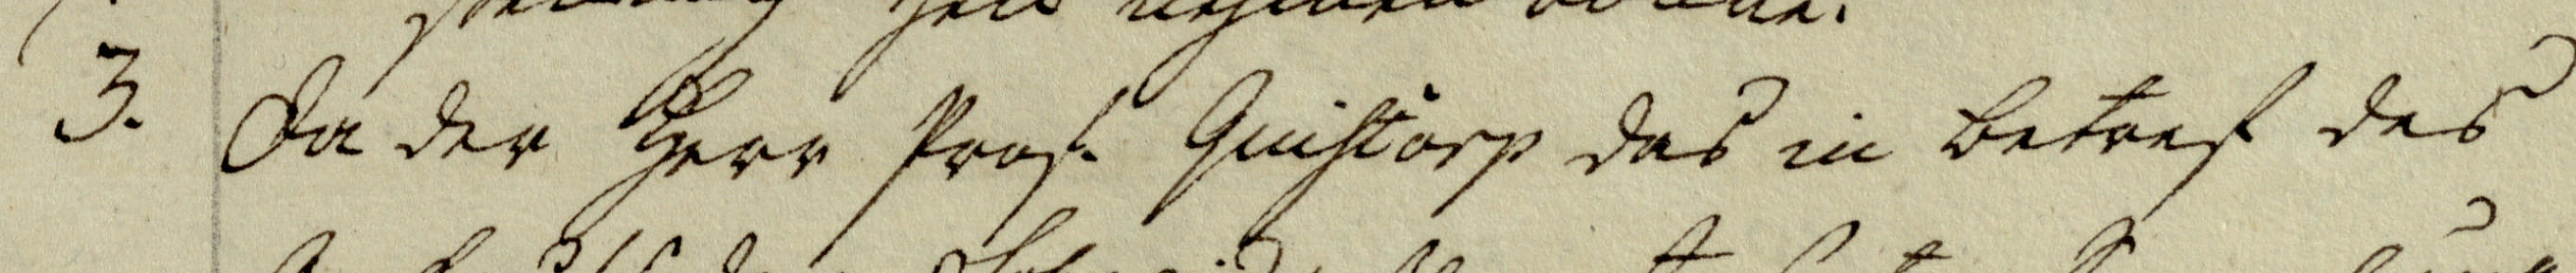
3. Da der Herr Prof. Quistorp das in Betref des
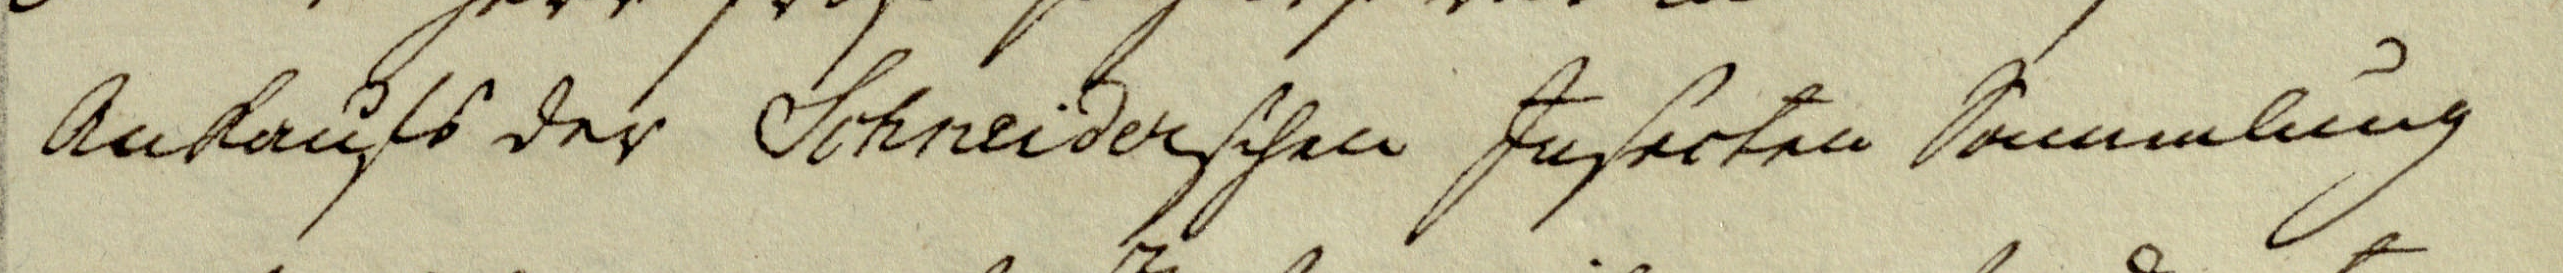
Ankaufs der Schneiderschen Insecten Sammlung
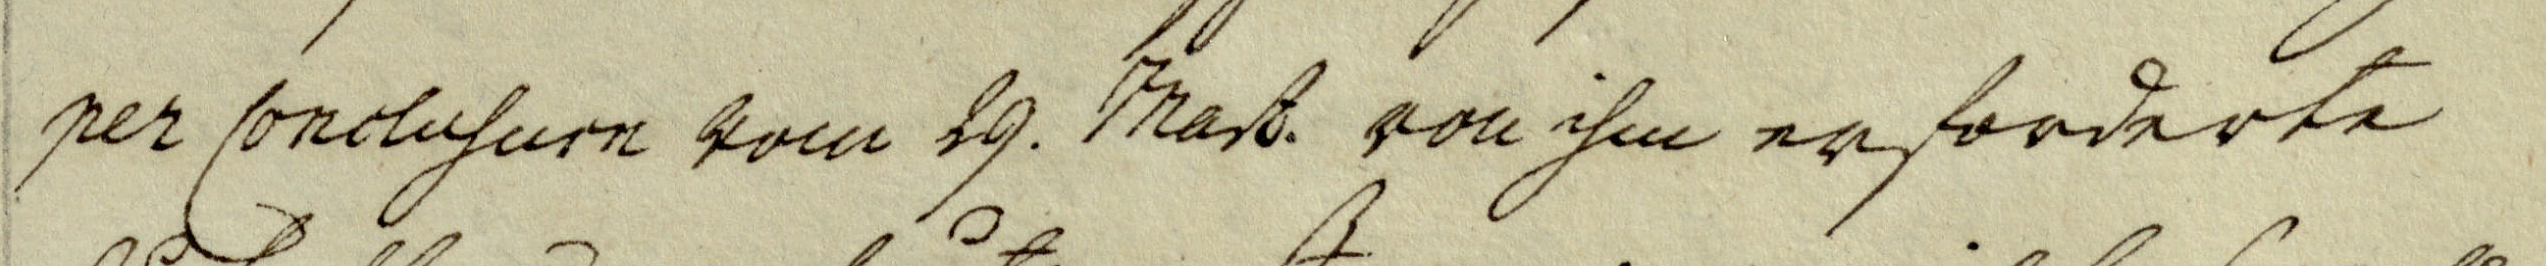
per Conclusum vom 29. Mart. von ihm erforderte
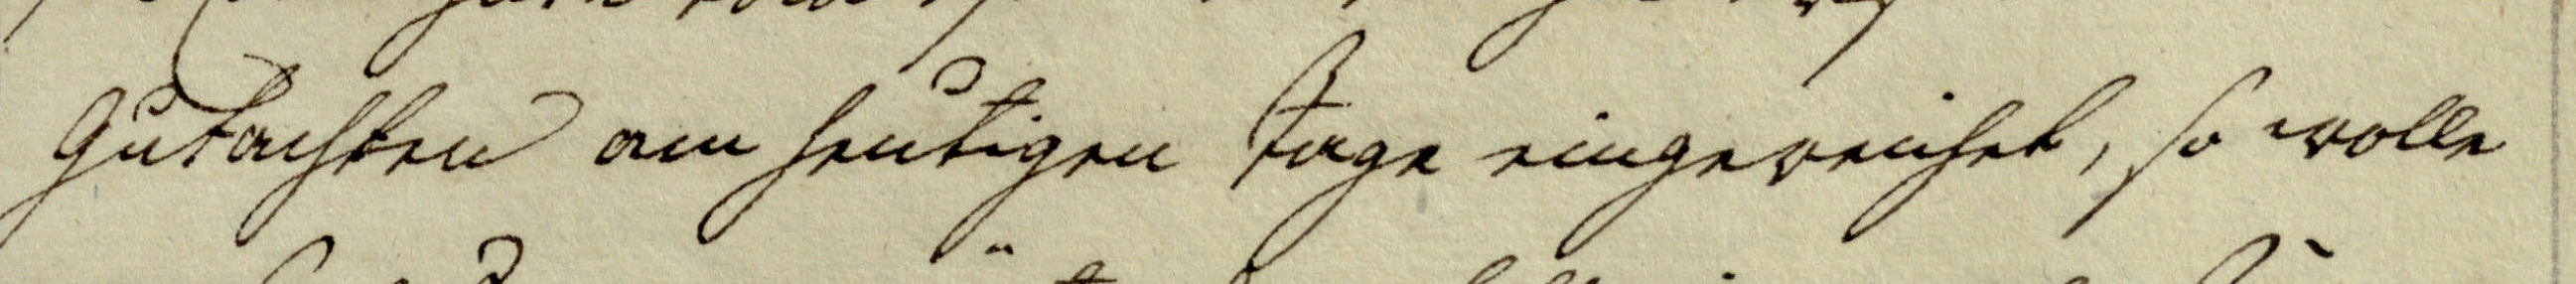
Gutachten am heutigen Tage eingereichet, so wolle
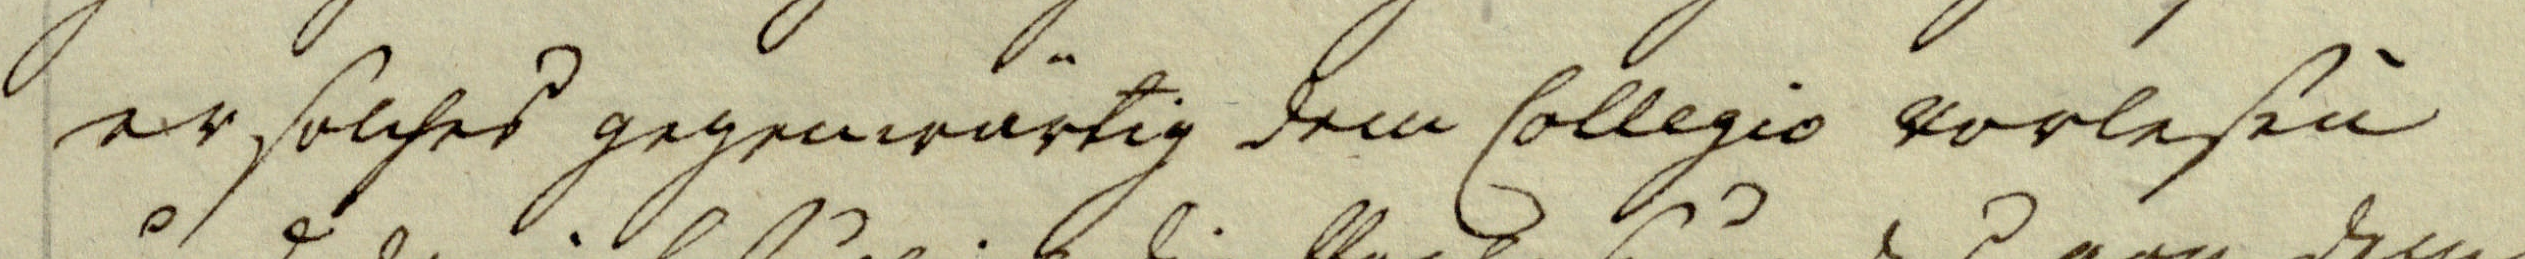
er solches gegenwärtig dem Collegio vorlesen
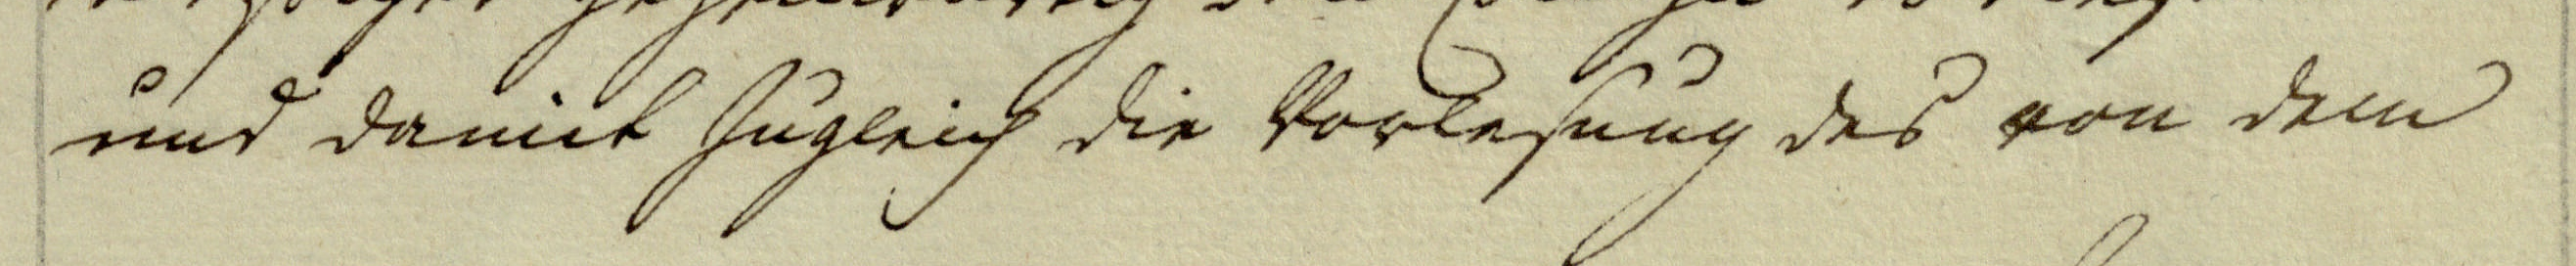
und damit zugleich die Vorlesung des von dem
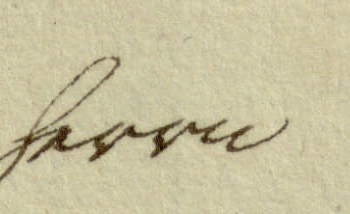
Herrn
